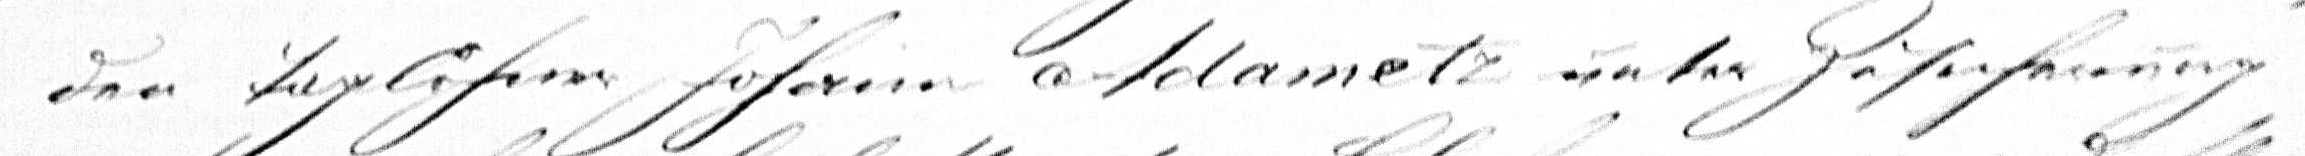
der Taglohner Johann Adametz unter Zusicherung
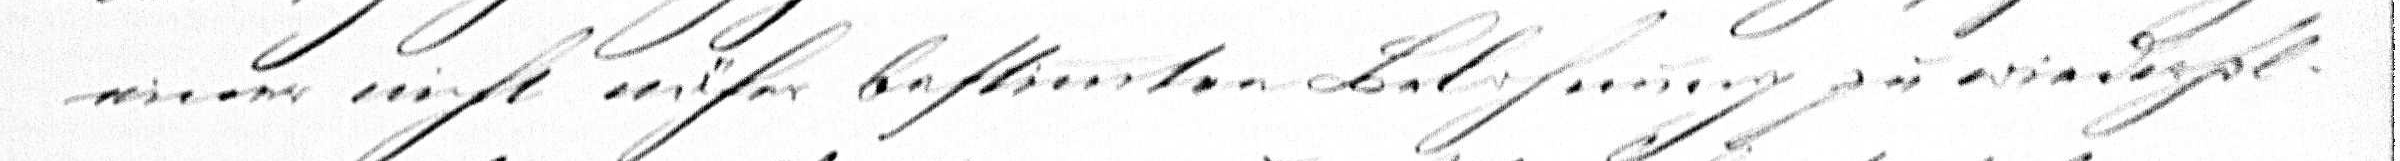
einer nicht näher bestimmte Belohnung zu wiederhol¬
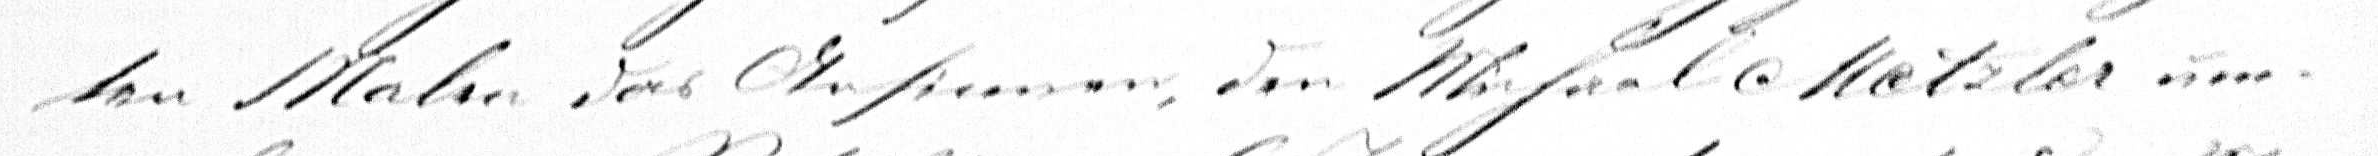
ten Malen das Ansinnen, den Michael Metzler um¬
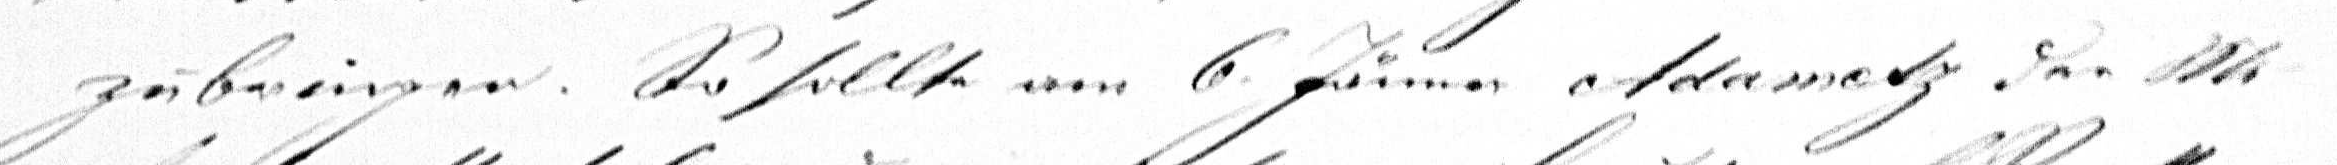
zubringen. So sollte am 6 Jänner Adametz den Mi¬
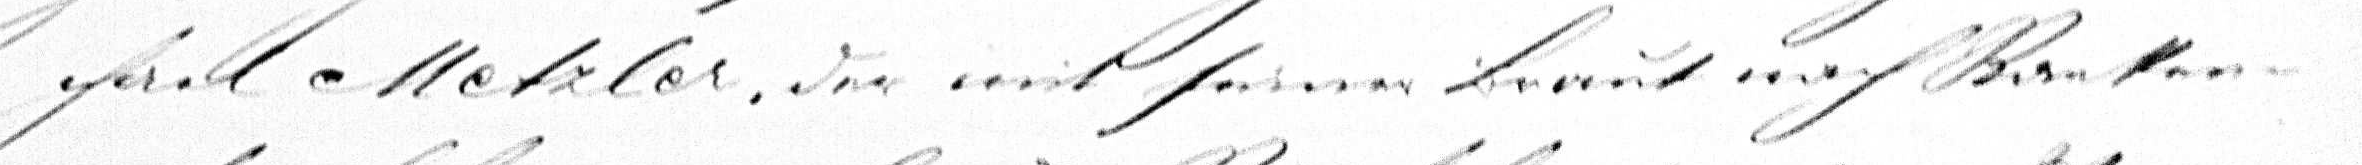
chael Metzler, der mit seiner Braut nach Banken¬
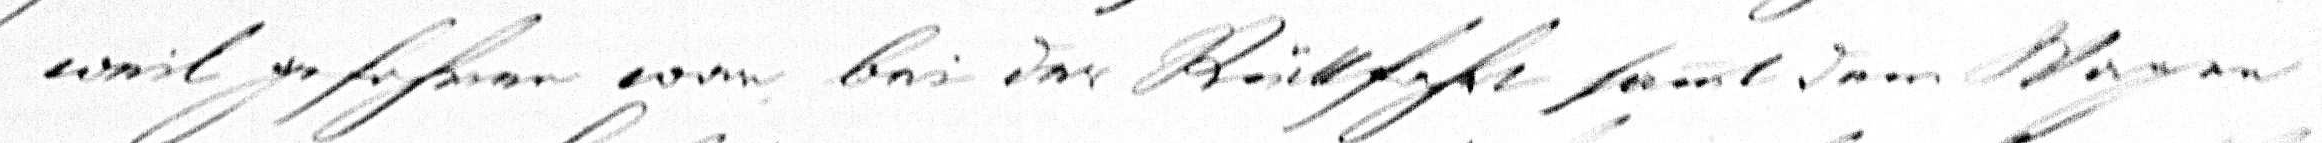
weil gefahren war bei der Rückfahrt samt dem Wagen
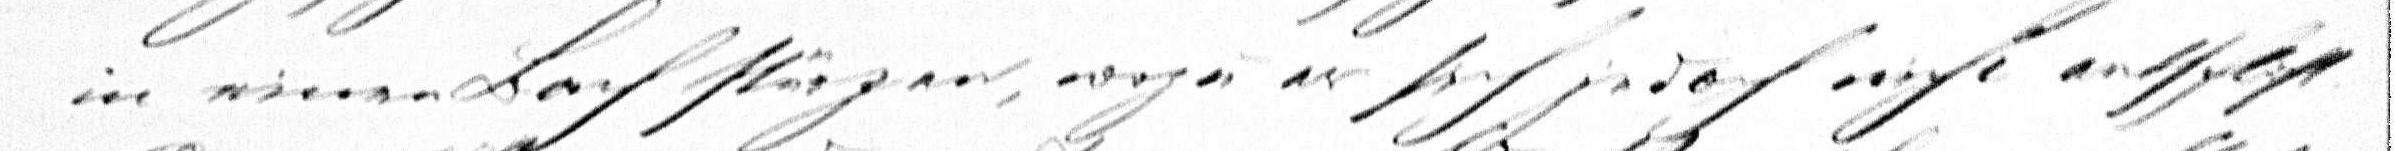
in einen Bach stürzen, wozu er sich jedoch nicht entschliß.
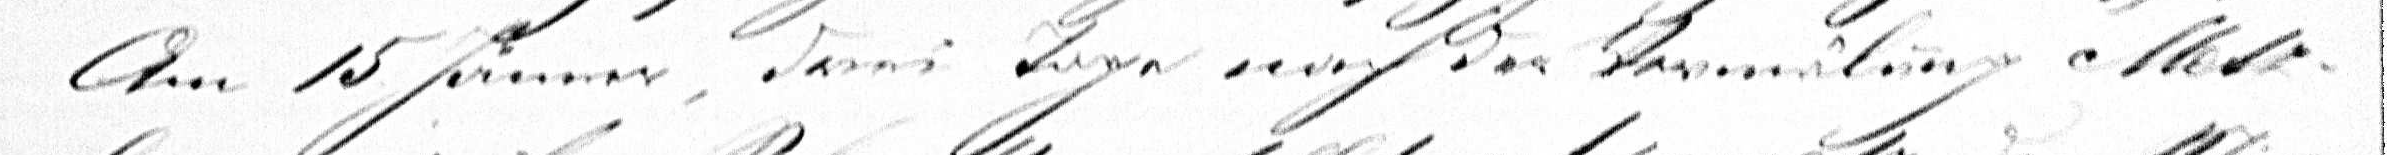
Am. 15 Jänner, drei Tage nach der Vermalung Metz¬
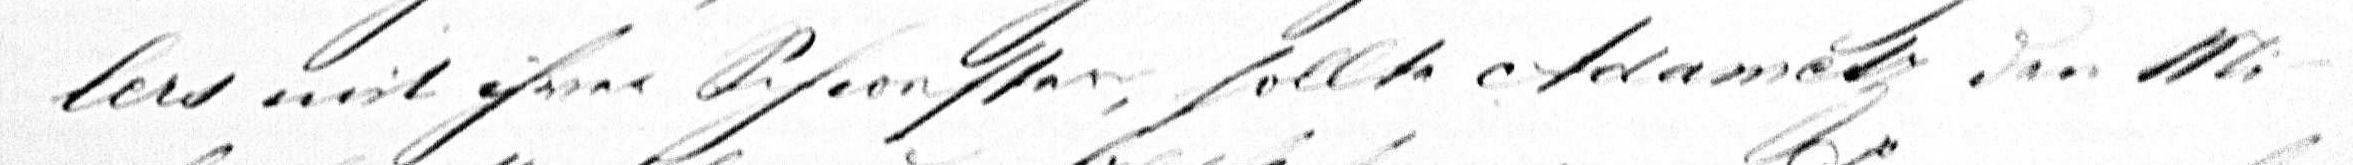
lers mit ihrer Schwester, sollte Adametz den Mi¬
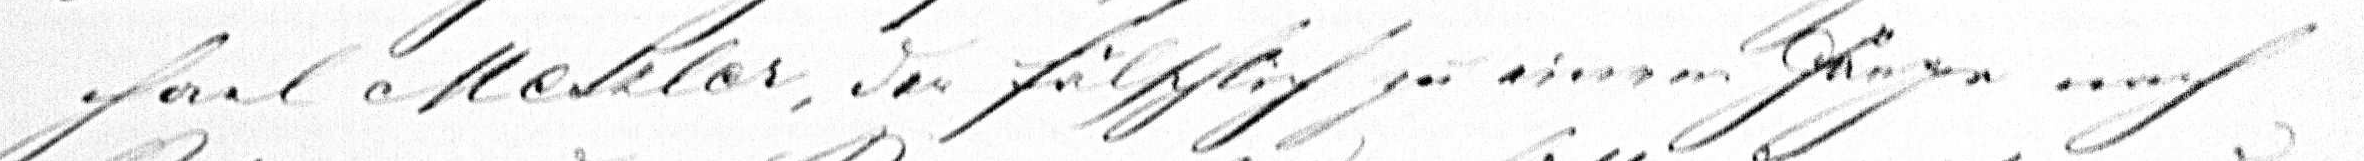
chael Metzler, der fälschlich zu einem Junge nach
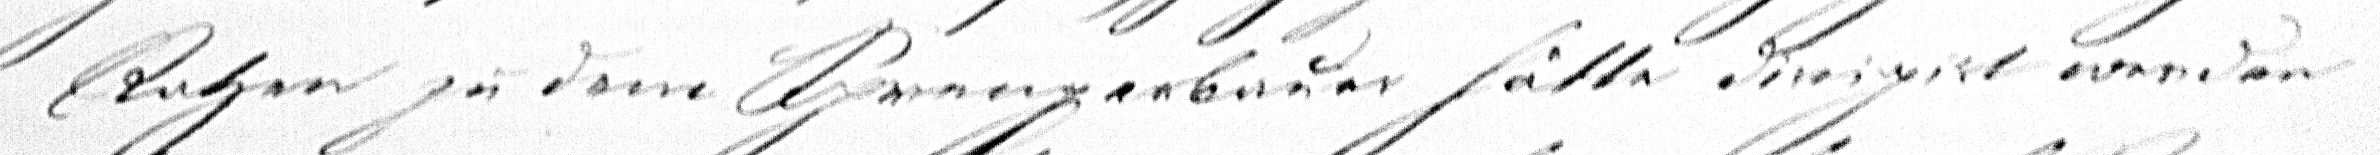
Ratzen zu dem Sprengerbauer hätte dirigirt werden
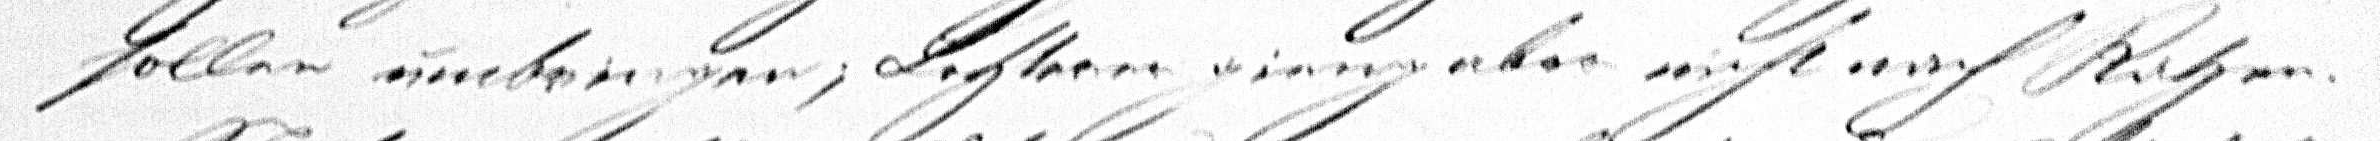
sollen umbringen; Letzterer gieng aber nicht nach Ratzen.
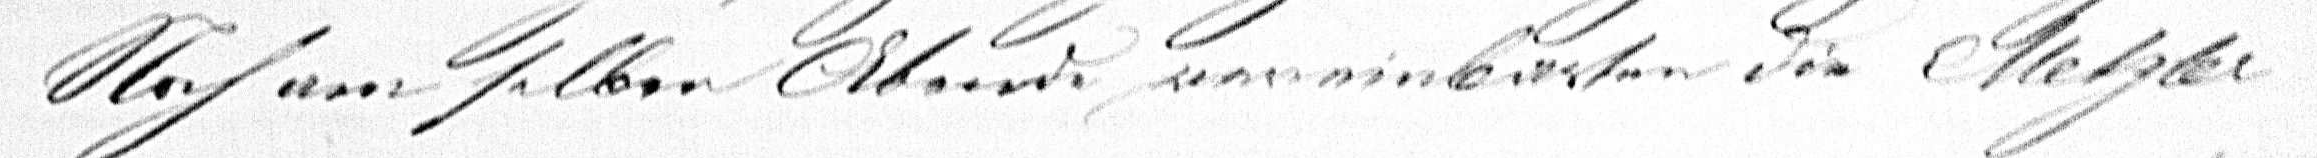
Noch am selben Abende vereinbarten die Metzler
